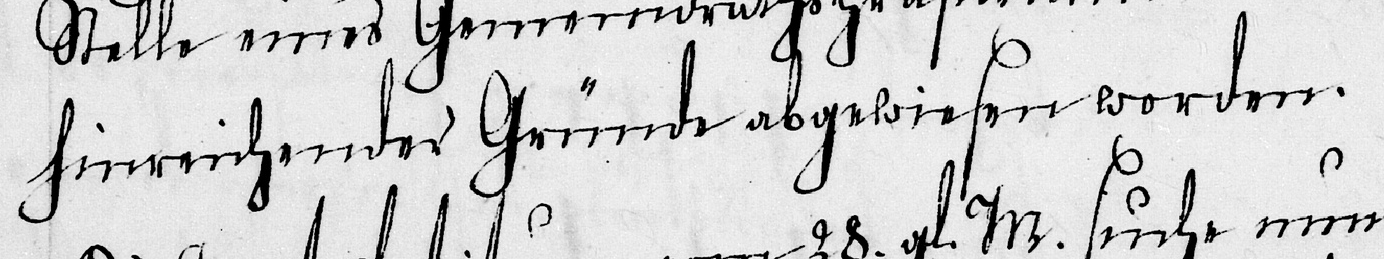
hinreichender Gründe abgewiesen worden.
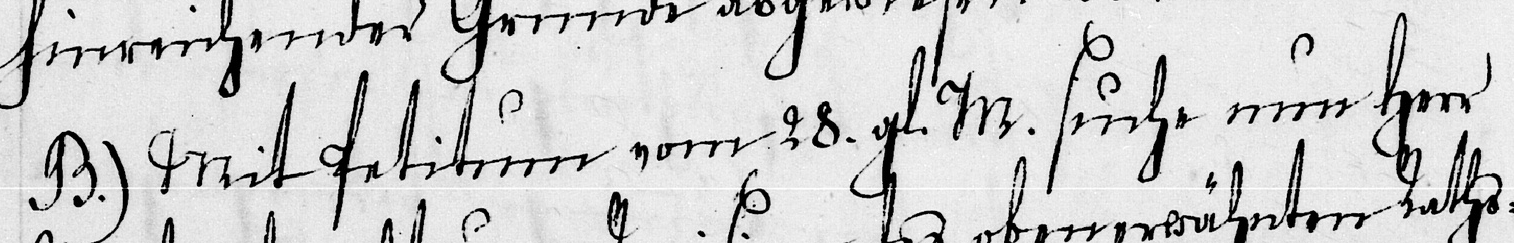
B.) Mit Petitum vom 28. gl. M. suche nun Herr
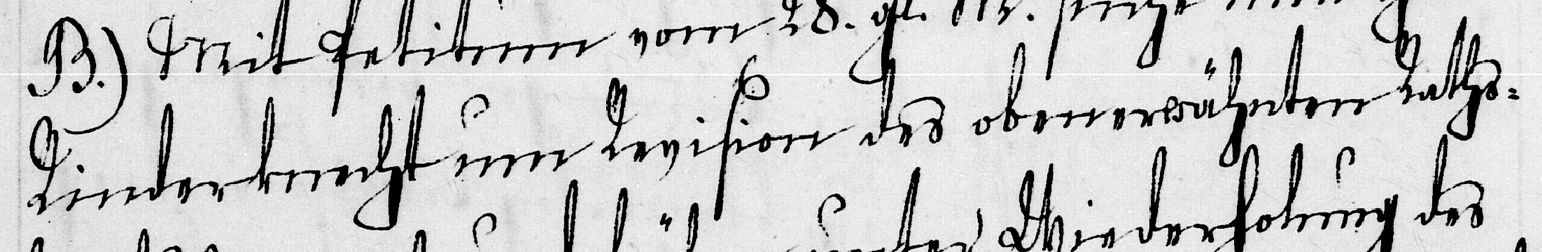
Rinderknecht um Revision des obenerwähnten Raths¬
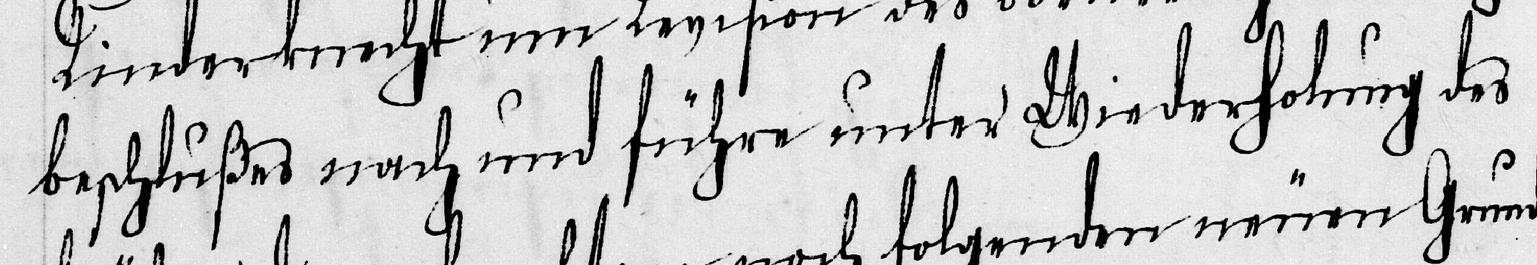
beschlußes nach und führe unter Wiederholung des
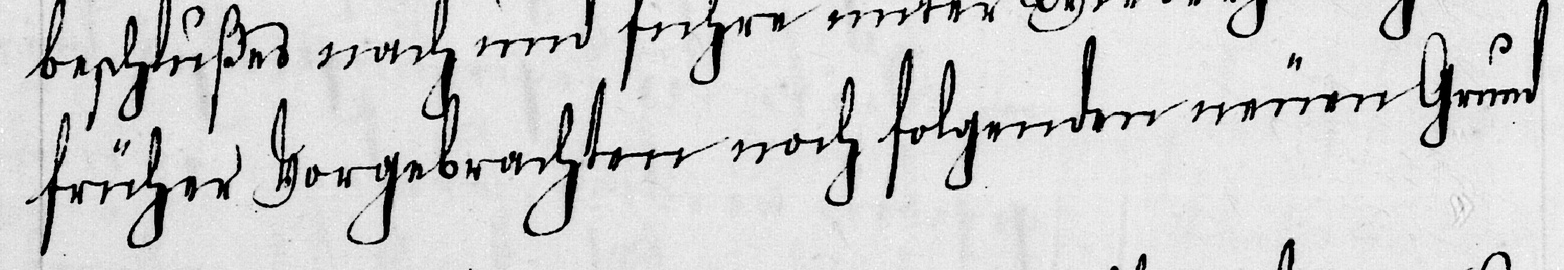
früher Vorgebrachten noch folgenden neuen Grund
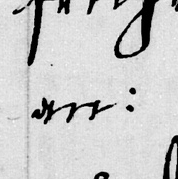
an:
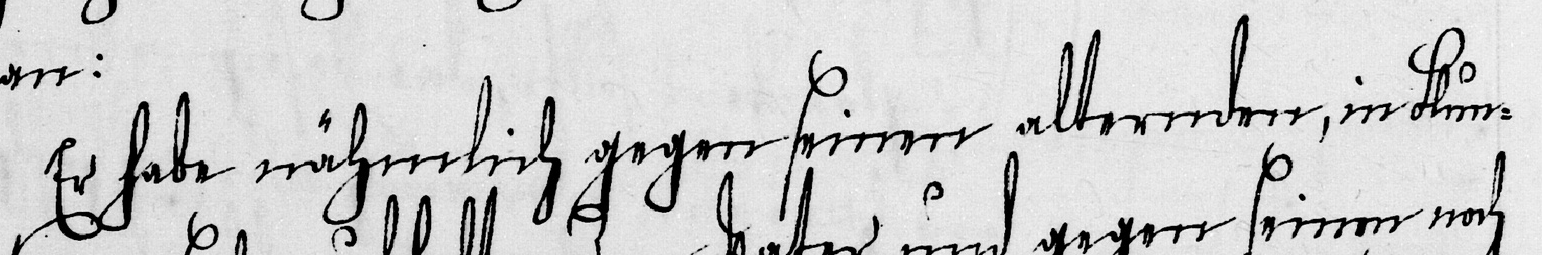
Er habe nähmlich gegen seinen alternden, in Flun¬
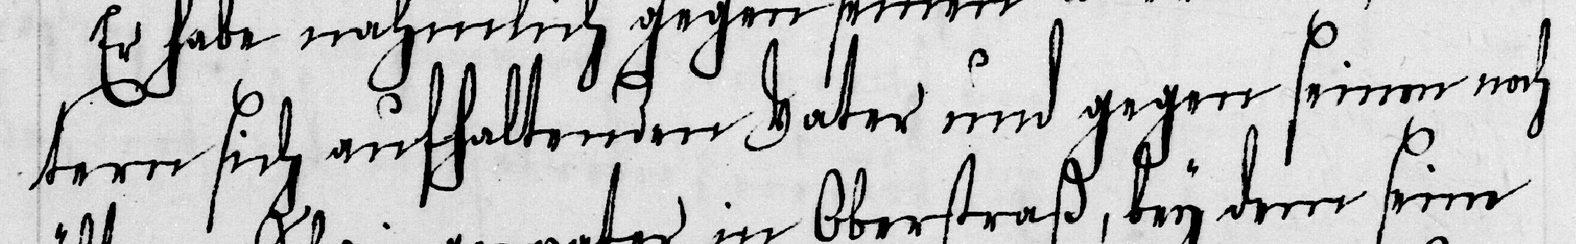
tern sich aufhaltenden Vater und gegen seinen noch
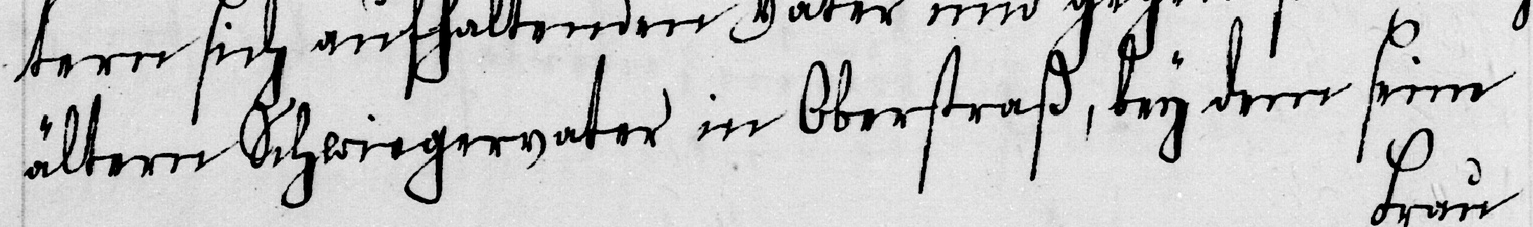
ältern Schwiegervater in Oberstraß, bey dem seine
